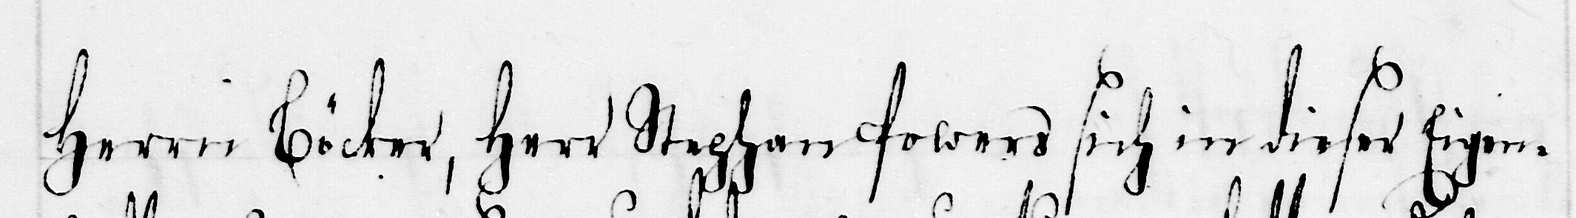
Herrn Böcker, Herr Stephan Powers sich in dieser Eigen¬
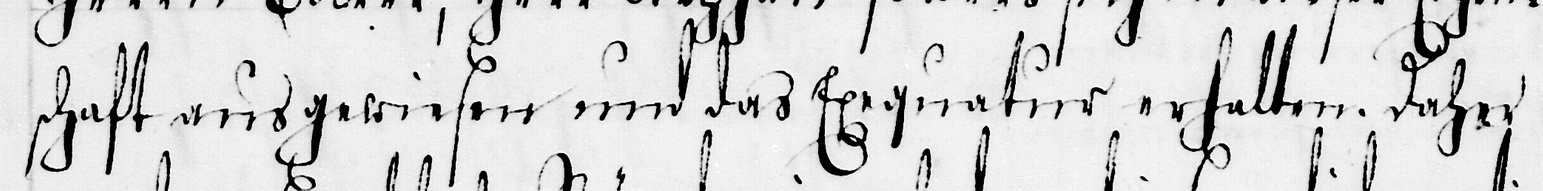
schaft ausgewiesen und das Exequatur erhalten. Daher
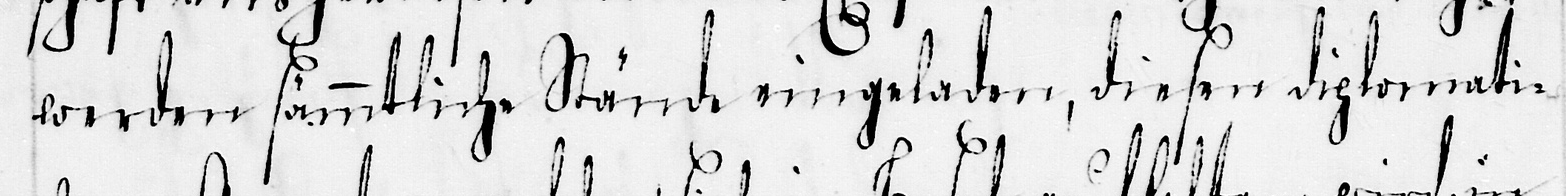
werden sämmtliche Stände eingeladen, diesen diplomati¬
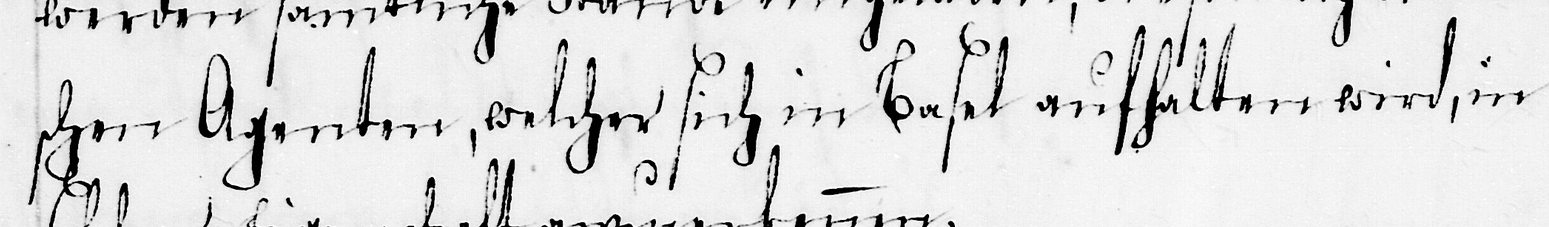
schen Agenten, welcher sich in Basel aufhalten wird, in
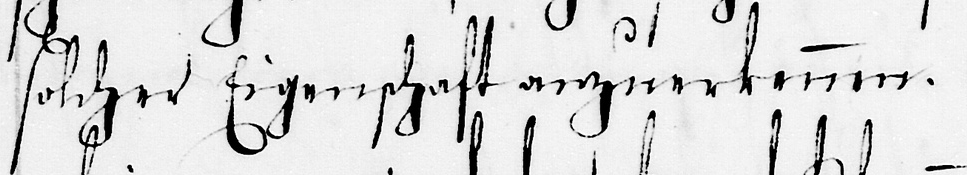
solcher Eigenschaft anzuerkennen.
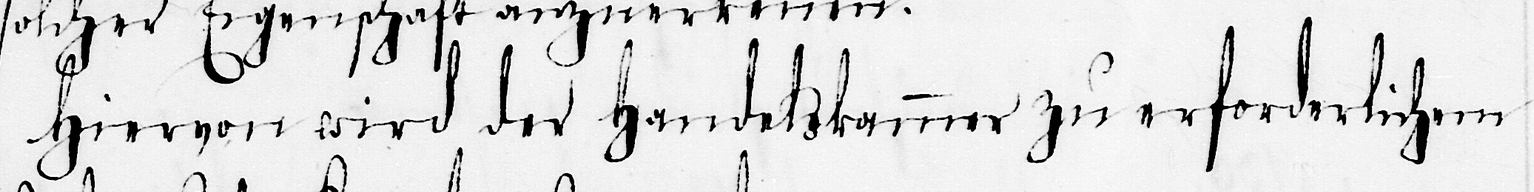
Hiervon wird der Handelskammer zu erforderlichem
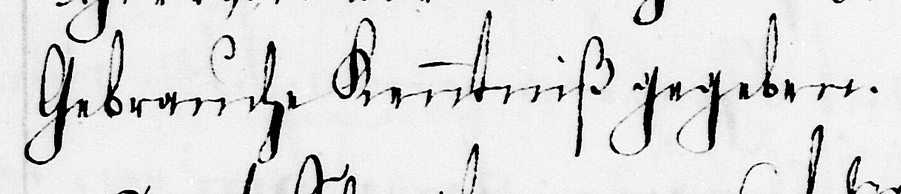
Gebrauche Kenntniß gegeben.
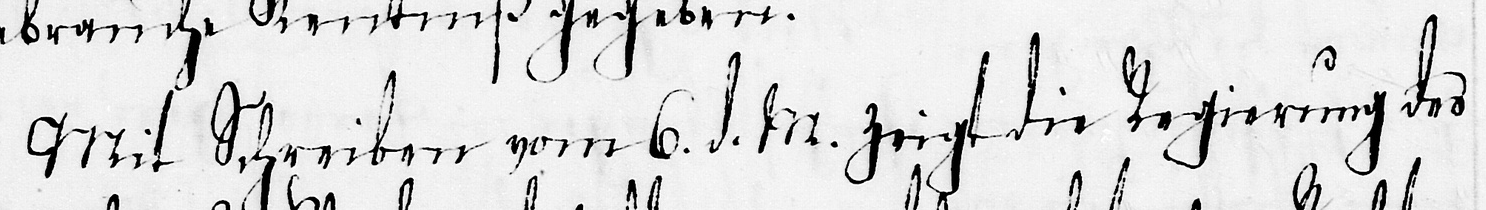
Mit Schreiben vom 6. d. M. zeigt die Regierung des
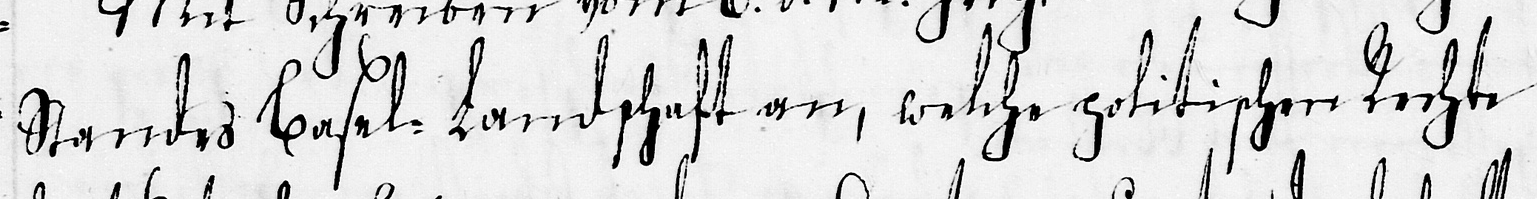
Standes Basel-Landschaft an, welche politischen Rechte
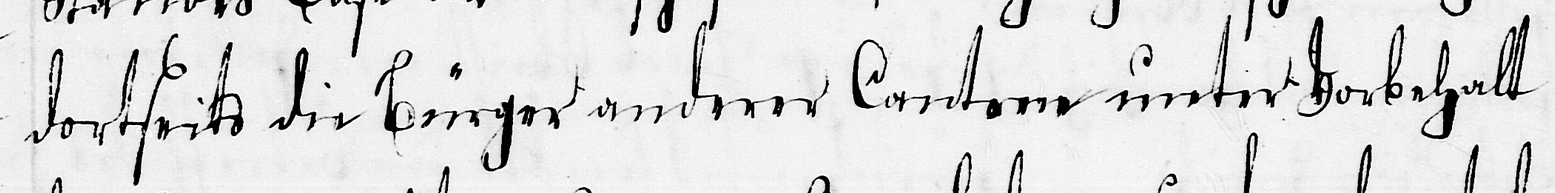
dortseits die Bürger anderer Cantone unter Vorbehalt
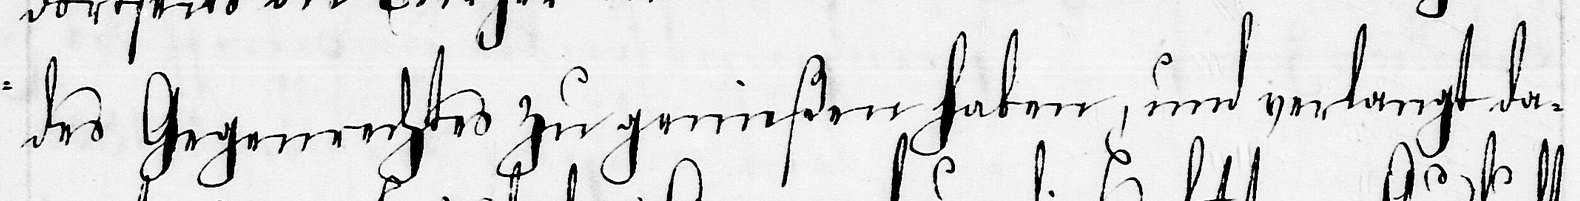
des Gegenrechtes zu genießen haben, und verlangt da¬
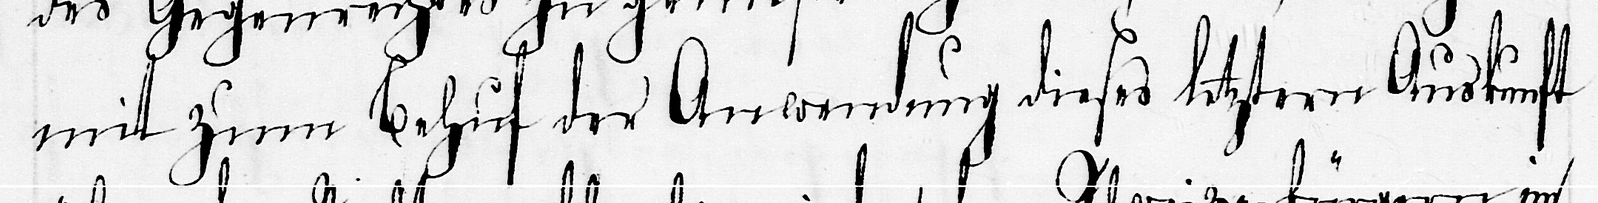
mit zum Behuf der Anwendung dieses letztern Auskunft
